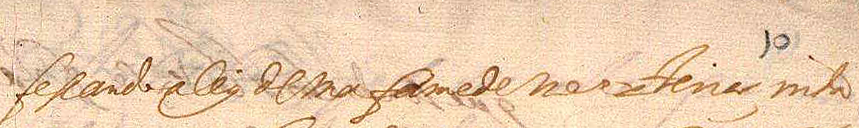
fessando a lej de mafamede no exterior, inda
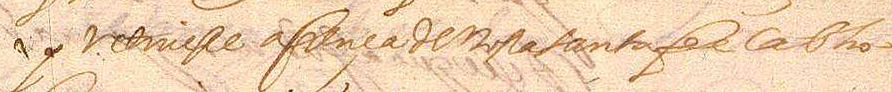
q̄ retiuesse a Crença de nossa santa fee catho
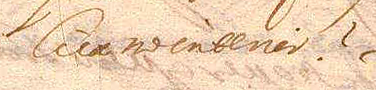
lica no interior?
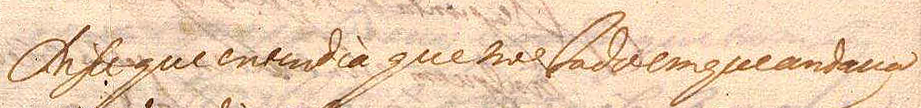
Disse que entendia que no estado em que andaua
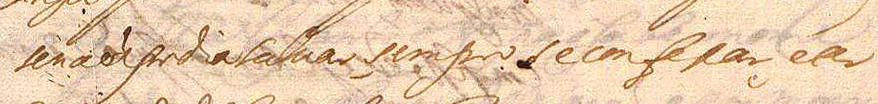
se naõ podia saluar sem pr.o se confessar e ter
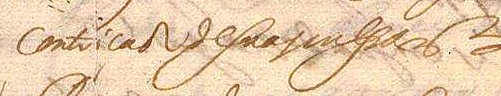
contriçaõ de suas culpas
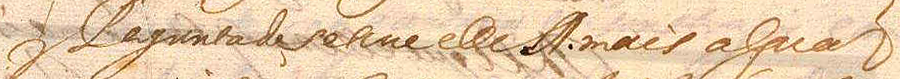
item Perguntado se teue elle R. mais alguā
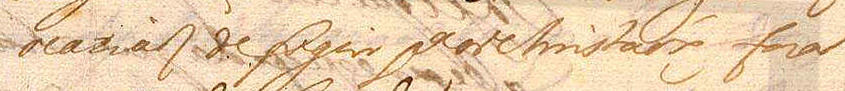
ocaziaõ de fugir pa os christaõs, fora
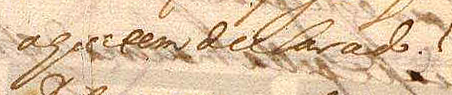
a que tem declarado?
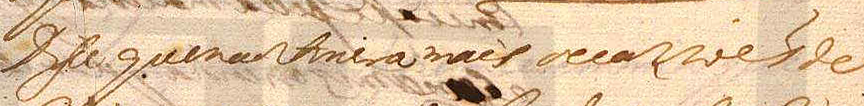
Disse que naõ tiuera mais occazioẽs de
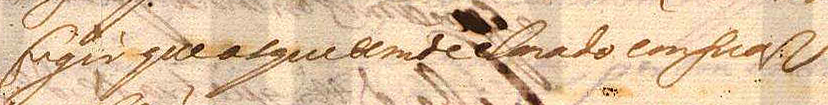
fugir que as que tem declarado em suas
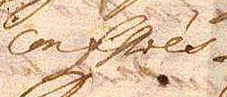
confissoẽs
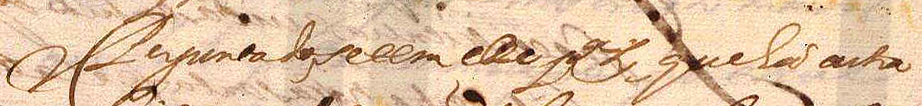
item Perguntado, se tem elle pa sy que ha outra
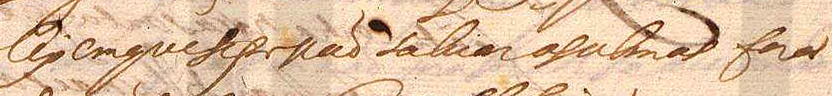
ley em que se possaõ saluar as almas fora
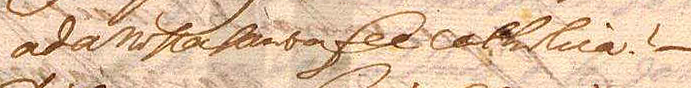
a da nossa santa fee catholica?
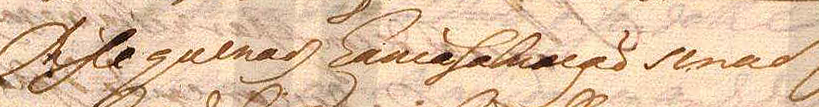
Disse que naõ hauia saluaçaõ senaõ
